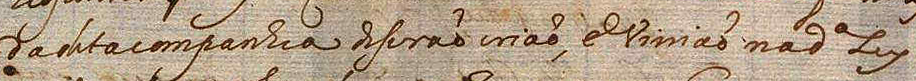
da dita companhia diseraõ criaõ, e Viuiaõ na da Ley
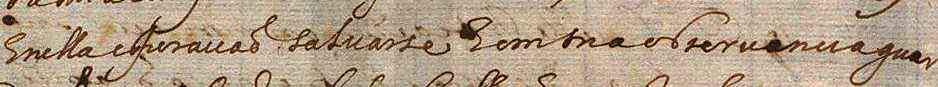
E nella esperauaõ saluarse E em sua obseruancia guar
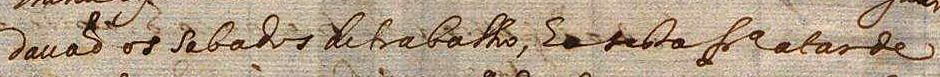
dauaõ os sabados de trabalho, E a sesta fra a tarde
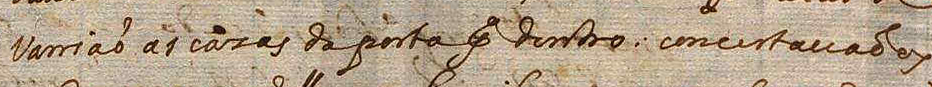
varriaõ as cazas da porta pa dentro: concertauaõ os
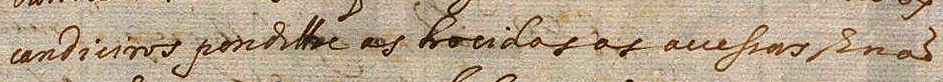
candieiros pondolhe as trocidas as auessas, E naõ
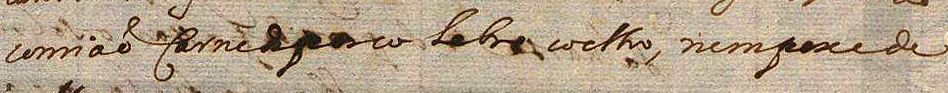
comiaõ Carne de porco, Lebre, coelho, nem pexe de
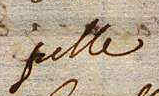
pelle
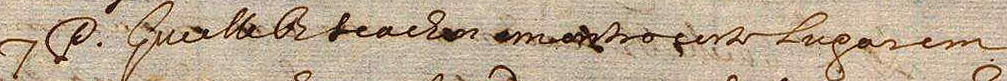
7 P. Que elle R se achou em outro certo Lugar em
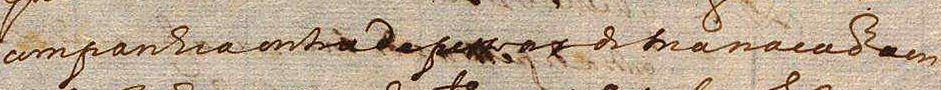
companhia outra de pessoas de sua naçaõ aon
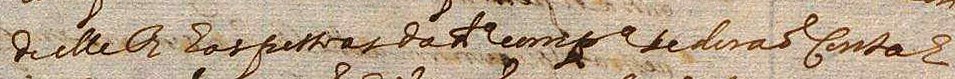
de elle R E as pessoas da d̄a compa se deraõ Conta E
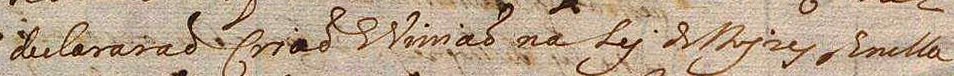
declararaõ Criaõ E Viuiaõ na Lej de Mojzes, E nella
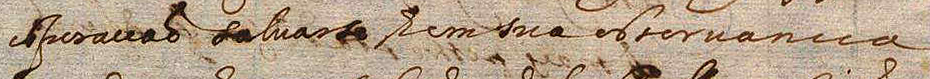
esperauaõ saluarse, E em sua obseruancia
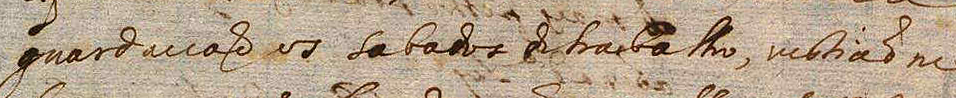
guardauaõ os sabados de trabalho, vestiaõ ne
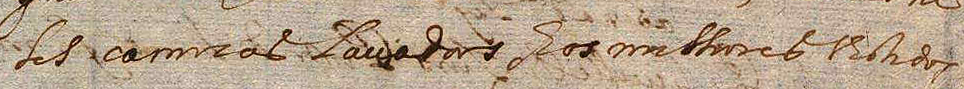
les camizas Lauadas, E os milhores vestidos
